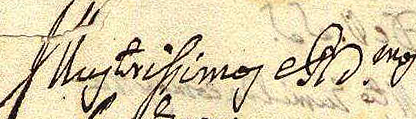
Jllustrissimos e Rd.mos
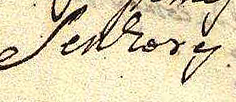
Senhores.
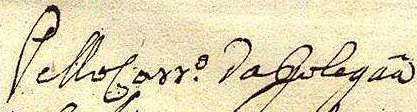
Pello Carr.o da Golegaā
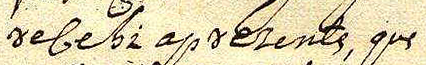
reCebi a prezente, que
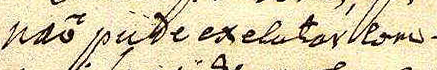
naõ pude executar com
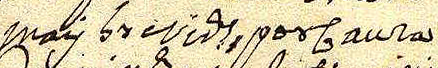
mais brevid.e, por Cauza
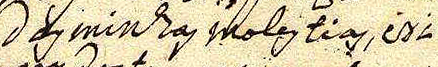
das minhas molestias, e ri
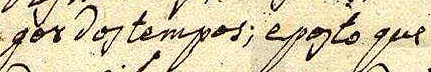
gor dos tempos; e posto que
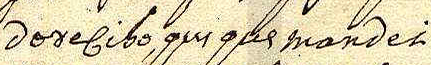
do reCibo, qui que mandei
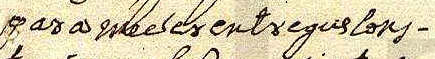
para me ser entregue Cons
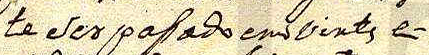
te ser passado em vinte e
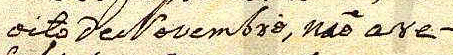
oito de Novembro, naõ a re
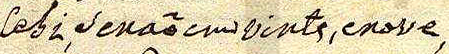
Cebi senaõ em vinte, e nove
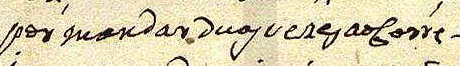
por mandar duas vezes ao Corre
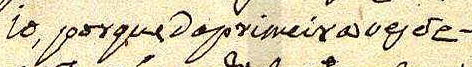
io, porque da primeira ves se
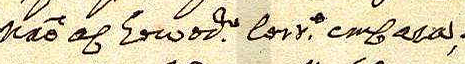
naõ aChou o d.o Corr.o em Caza;
